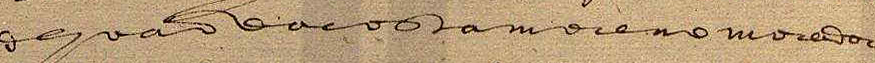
de joaõ da costa moreno morador
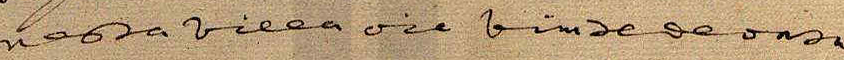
nesta villa oie vimte de outu
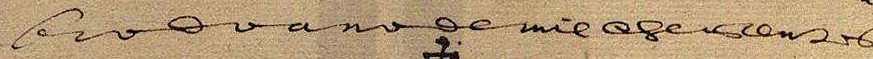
bro do ano de mil e seiscentos
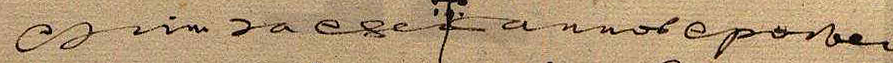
e trimta e seis annos e por ver
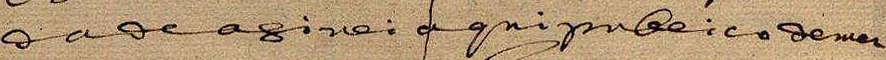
dade asinei aqui publico de meu
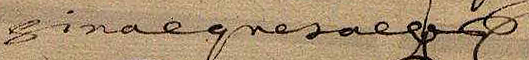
sinal que tal he
